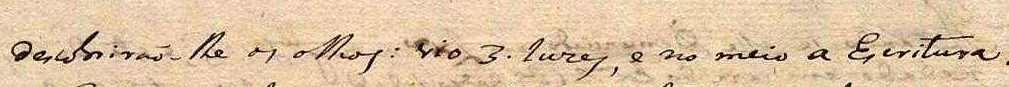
descobriraõ-lhe os olhos: vio 3. luzes, e no meio a Escritura.
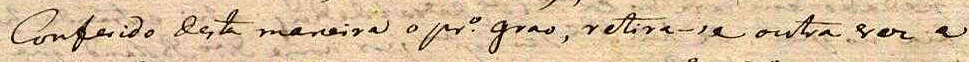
Conferido deste maneira o pr.o grao, retira-se outra vez, a
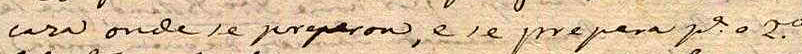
caza onde se preparou, e se prepara p.a o 2.o
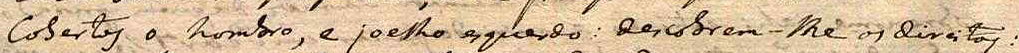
Cobertos o hombro, e joelho esquerdo: descobrem-lhe os direitos:
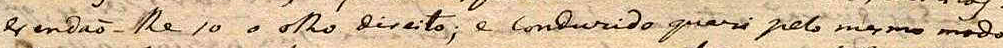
vendaõ-lhe so o olho direito; e conduzido quazi pelo mesmo modo
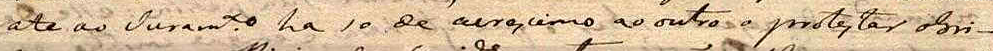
ate ao Iuramt.o ha so de acrescimo ao outro o protestar obri
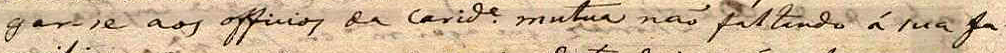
gar-se aos officios da carid.e mutua naõ faltando á sua fa
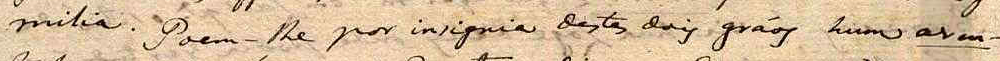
milia. Poem lhe por insignia deste dois gráos hum aven
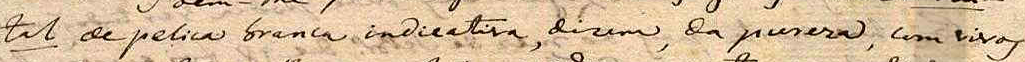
tal de pelica branca indicativa, dizem, da pureza, com vivos
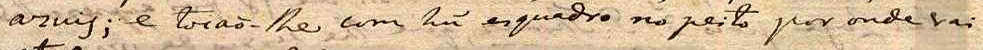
azuis; e tocaõ-lhe com hū esquadro no peito por onde vai
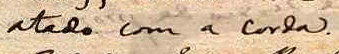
atado com a corda.
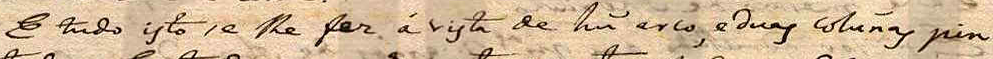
E tudo isto se lhe fez a vista de hū arco, e duas colunas pin
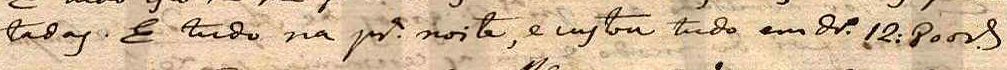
tadas. E tudo na pr.a noite e custou tudo em dr.o 12:800 rs.
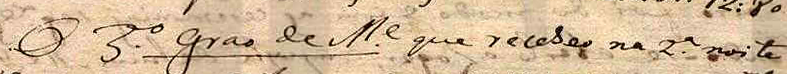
O 3.o Grao de M.e que recebeo na 2.a noite
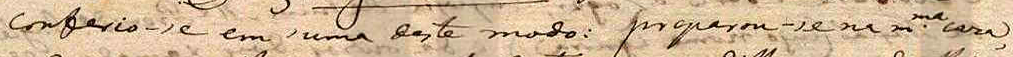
conferio-se em suma deste modo: preparou-se na m.ma caza,
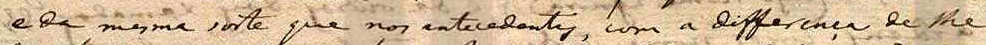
e da mesma sorte que nos antecedentes, com a differença de lhe
